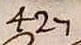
427
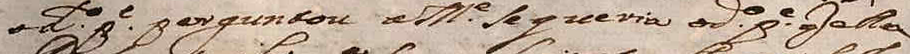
o d̄.o p.e perguntou a M.e se queria o d.o p.e q̄ ella
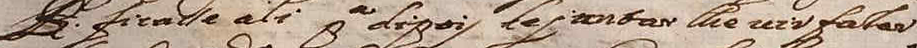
R. ficasse ali pa dipois de jantar lhe uir falar
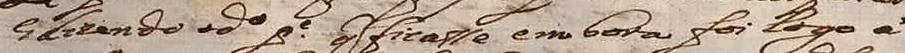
E dizendo o d.o p.a q̄ ficasse embora foi logo a
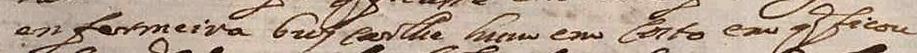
enfermeira buscarlhe hum emCosto em q̄ ficou
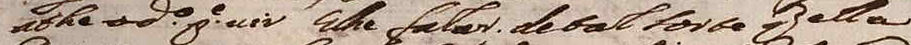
athe o d.o p.a uir E lhe falar de tal sorte q̄ ella
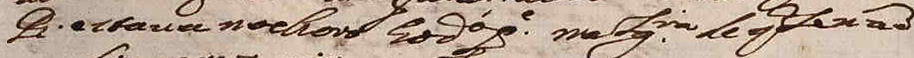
R. estaua no choro E o d.o p.e na Igra. de q̄ se naõ
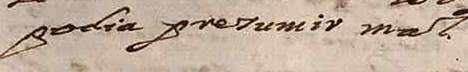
podia presumir mal
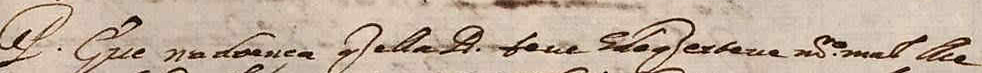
P. Que no doença q̄ ella R. teue E de q̄ estaua m.to mal lhe
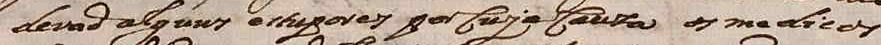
davaõ alguns estupores por Cuja Cauza os medicos
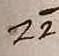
22
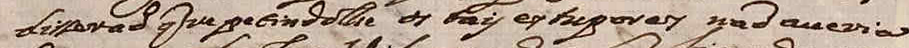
disseraõ q̄ repetindolhe os tais estupores naõ aueria
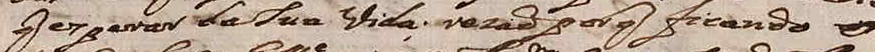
q̄ esperar da sua Vida rezaõ porq̄ ficando o
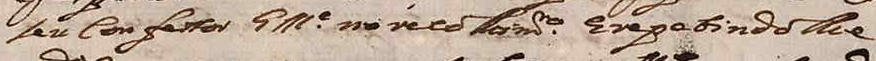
seu Confessor E M.e no recolhim.to E repetindolhe
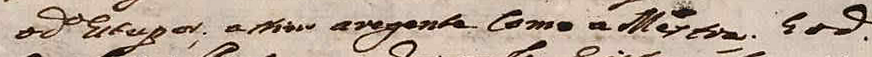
o do Estupor; assim a regente como a Mestra. E o d.o
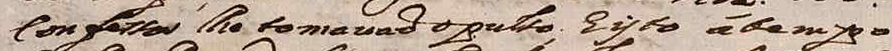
Confessor lhe tomauaõ o pulso E isto a tempo
